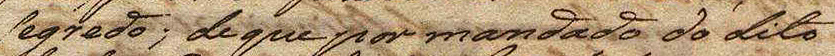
segredo; de que por mandado do dito
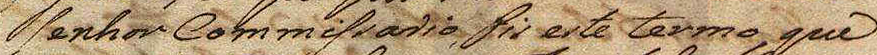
senhor Commissario, fis este termo, que
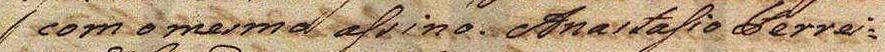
com o mesmo assino. Anastasio Ferrei
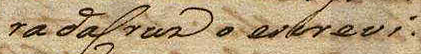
ra da Cruz o escrevi.
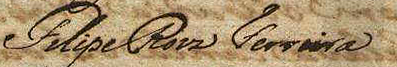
Filipe Roiz Ferreira
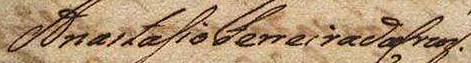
Anastasio Ferreira da Cruz.
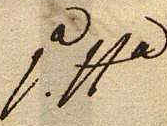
1.a tta
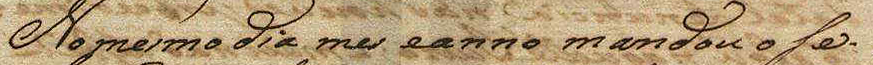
No mesmo dia mes e anno mandou o se
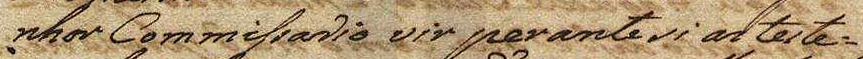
nhor Commissario vir perante si as teste
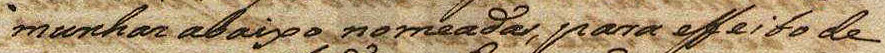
munhaz abaixo nomeadas, para effeito de
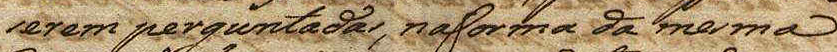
serem perguntadas, na forma da mesma
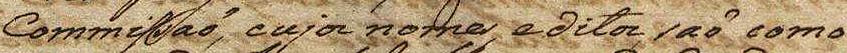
Commissaõ, cujoz nomes, e ditoz saõ como
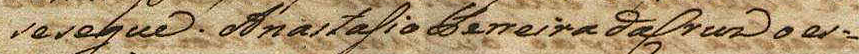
se segue. Anastasio Ferreira da Cruz o es
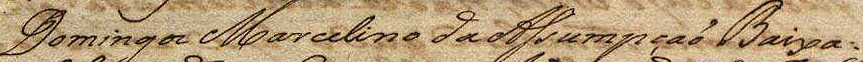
Domingos Marcelino da Assumpçaõ Baixa
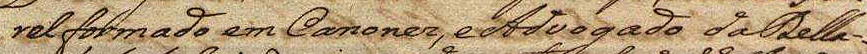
rel formado em Canonez, e Advogado da Rella
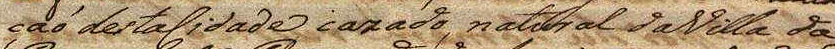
çaõ desta Cidade cazado, natural da Villa da
